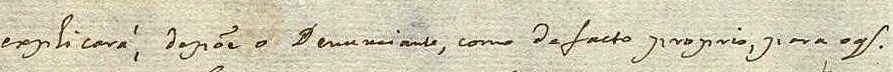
explicará, depõe o Denunciante, como de facto proprio, para o q̄.
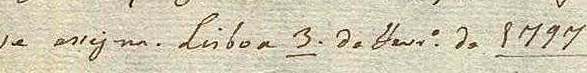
se assigna. Lisboa 3. de Fevr.o de 1797
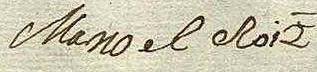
Manoel Roiz̄
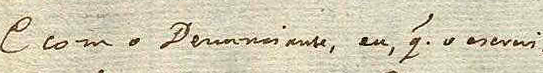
E com o Denunciante, eu, q̄ o escrevi.
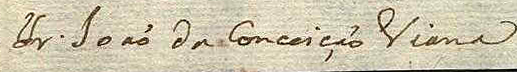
Fr. Ioaõ da Conceição Viana
